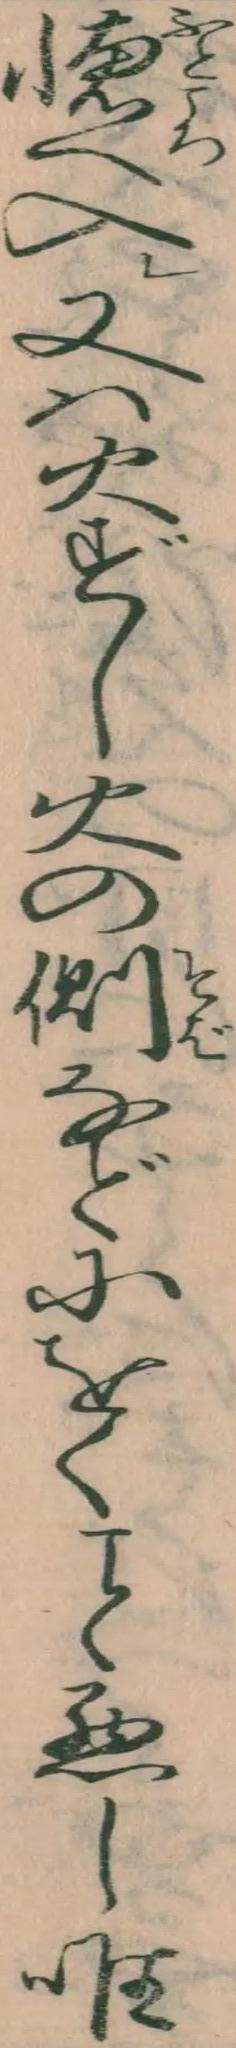懐へ入れ又は火ずし火の側などにをくこと悪し唯
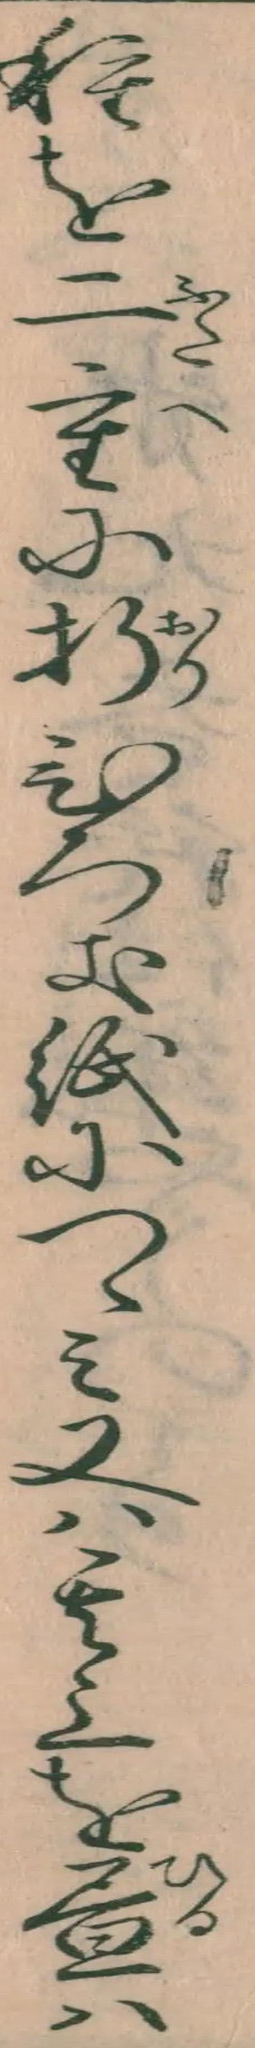種を二重に折ひろき紙につゝみ又は其上を昼は
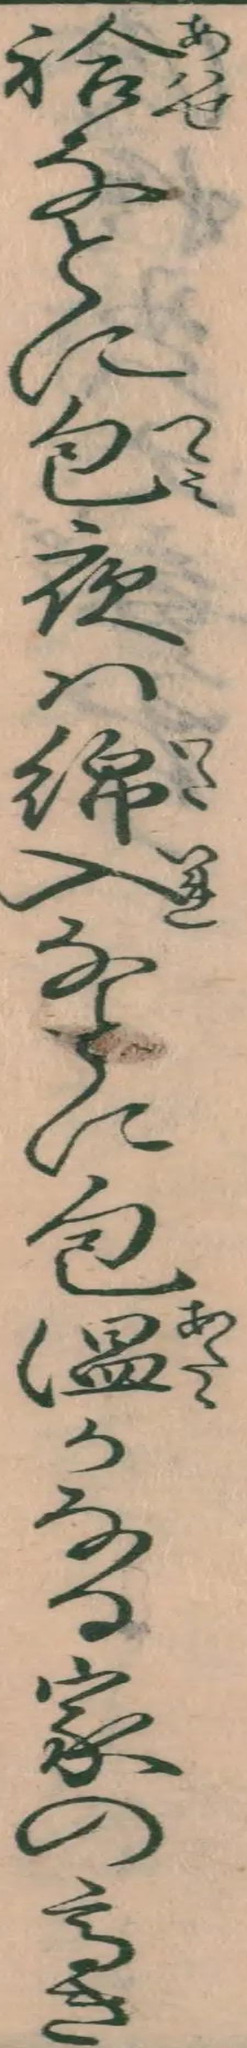袷なとに包夜は綿入なとに包温かなる家の高き
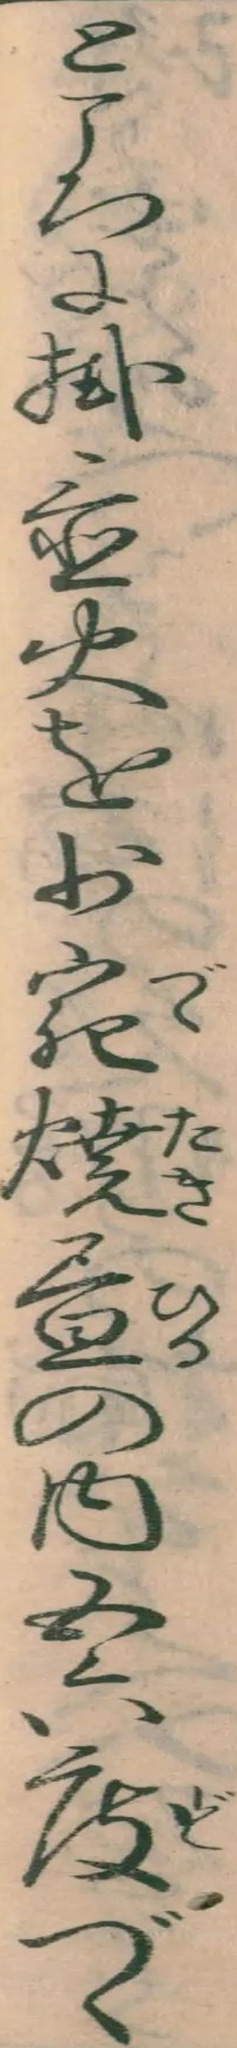ところに掛置火を少宛焼昼の内五六度づゝ
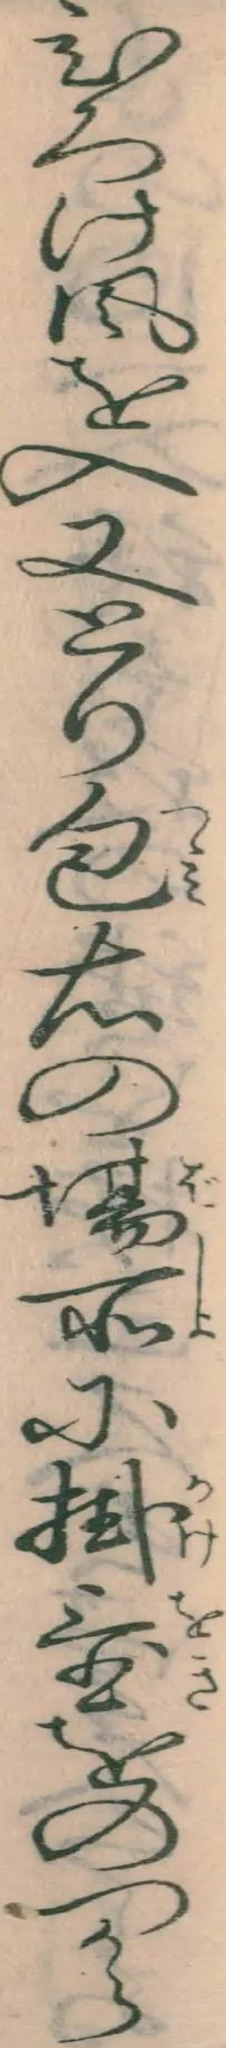ひろけ風を入又とり包右の場所に掛置をのつから
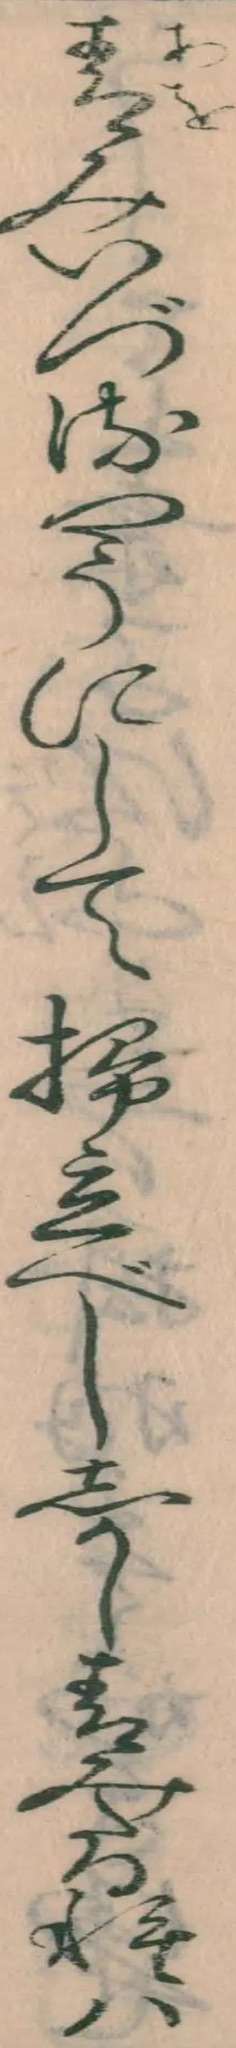青みいづるやうにして掃立べししかし青みたる種は
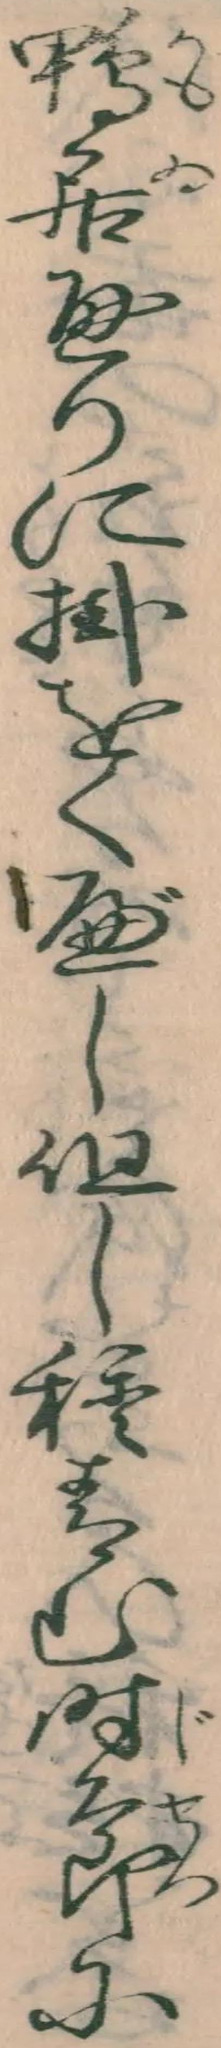鴨居通りに掛をくべし但し種青む時節に
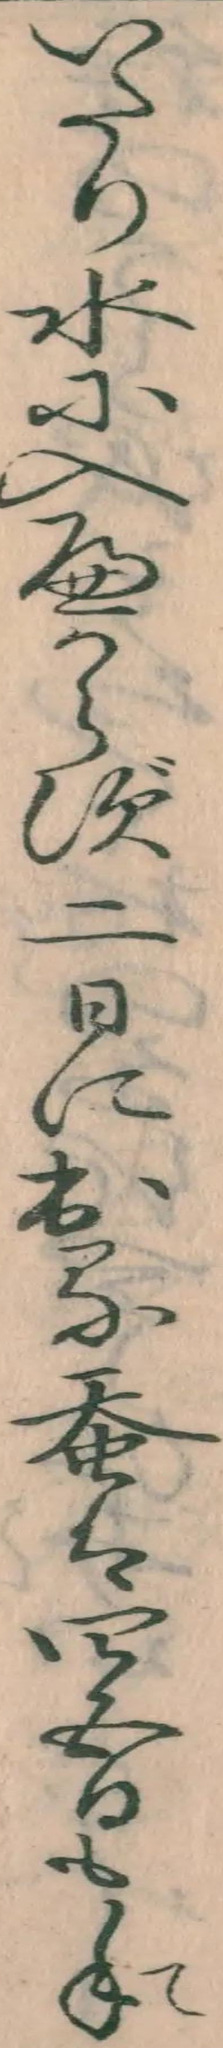いたり水に入へからず二日に出る蚕は四五日も手
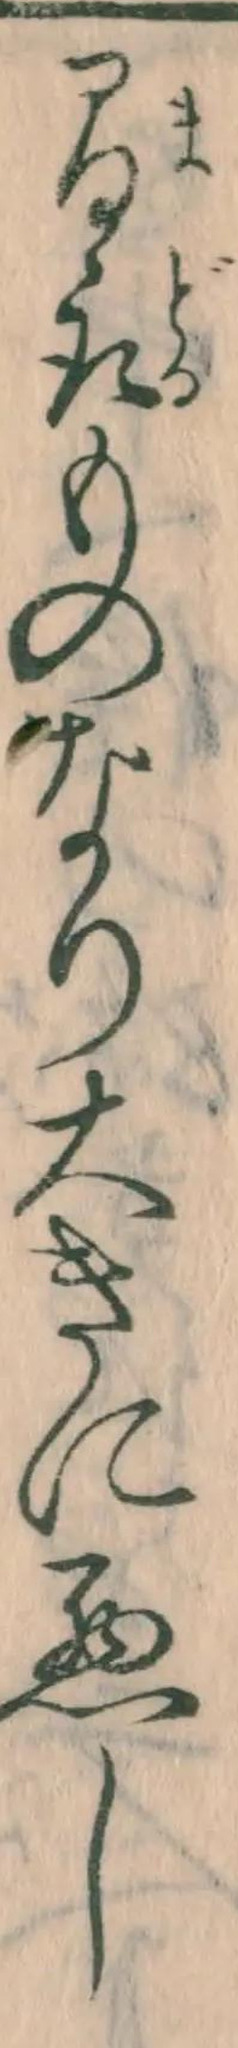間取ものなり大きに悪し
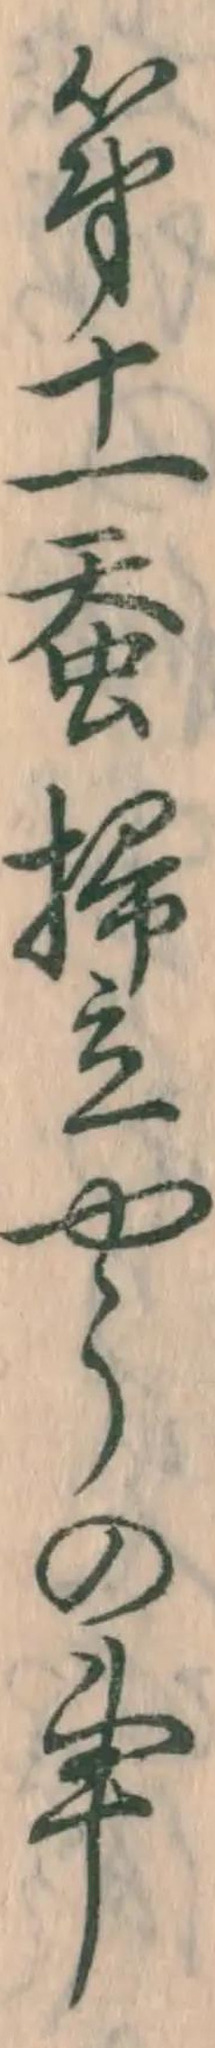第十一蚕掃立やうの事
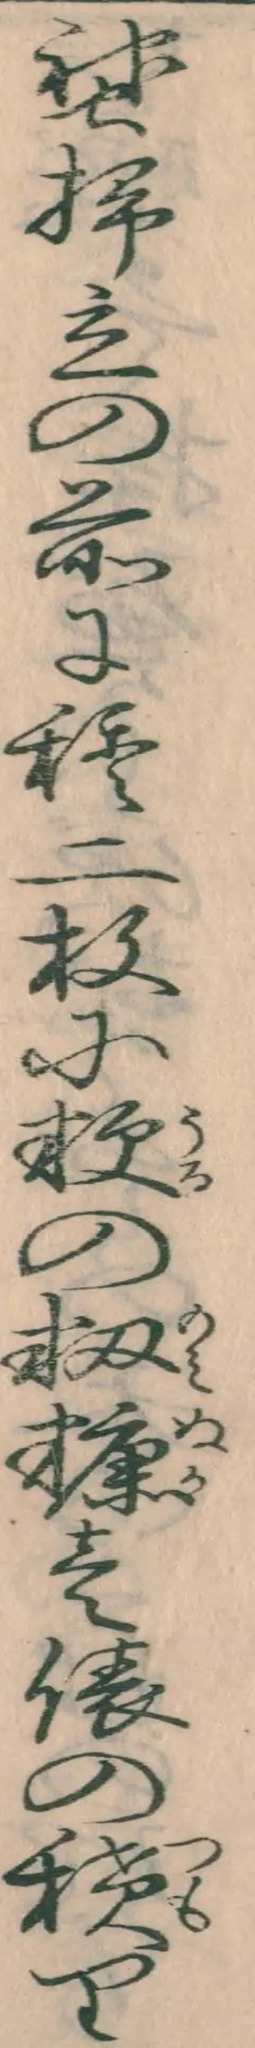䗝掃立の前に種二枚に粳の籾糠壱俵の積り
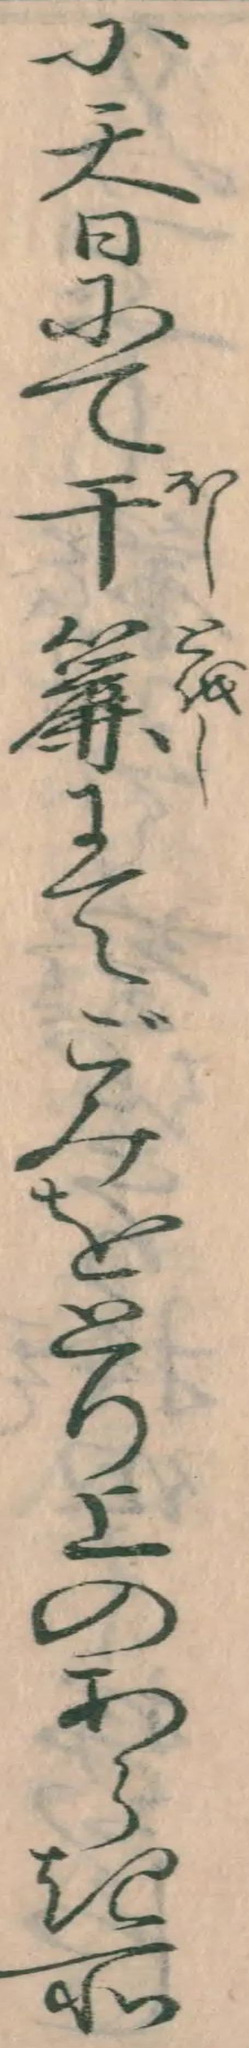に天日にて干簾にてごみをとり上のあらき所
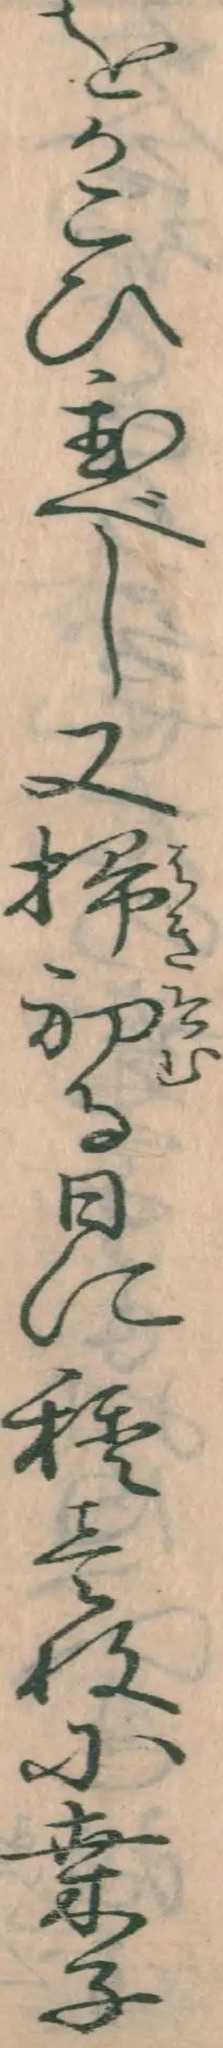をかこひ置べし又掃初る日に種壱枚に桑子

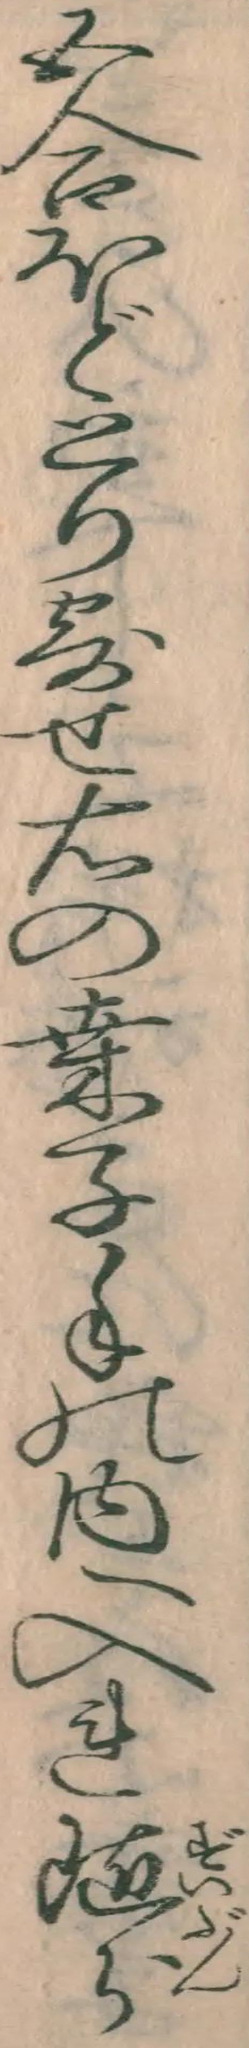五合ほどとり寄せ右の桑子手の内へ入れ随分
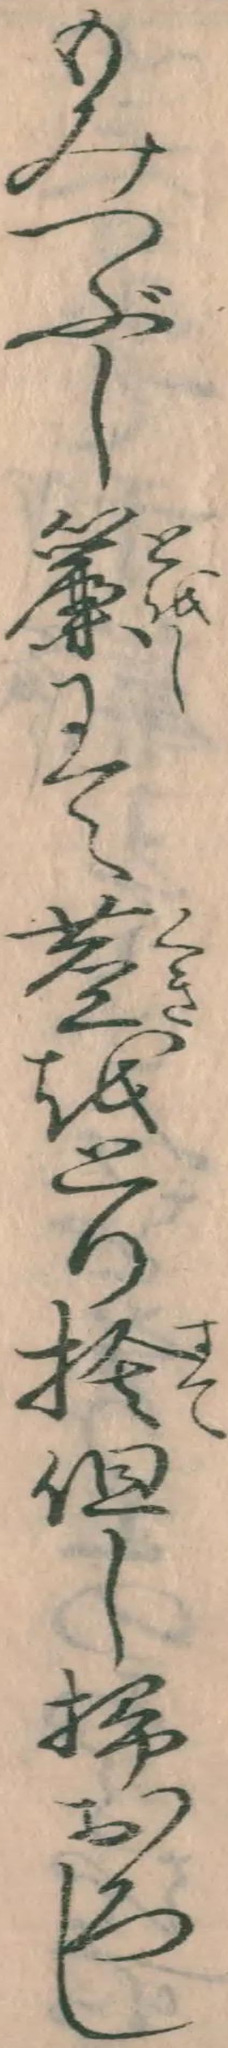もみつぶし簾にて茎をとり捨但し掃おろし
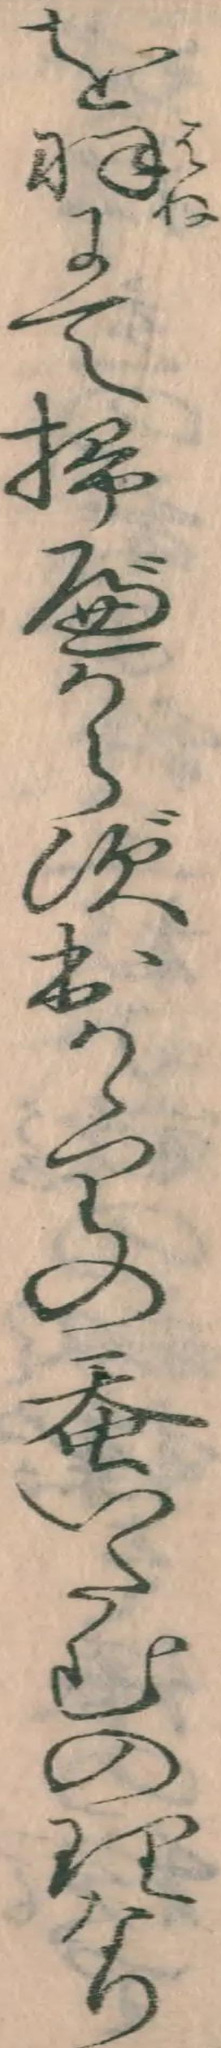を羽にて掃べからず出かゝりの蚕いたむの理なり
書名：新撰養蚕秘書
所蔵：国立国会図書館 National Diet Library, JAPAN
